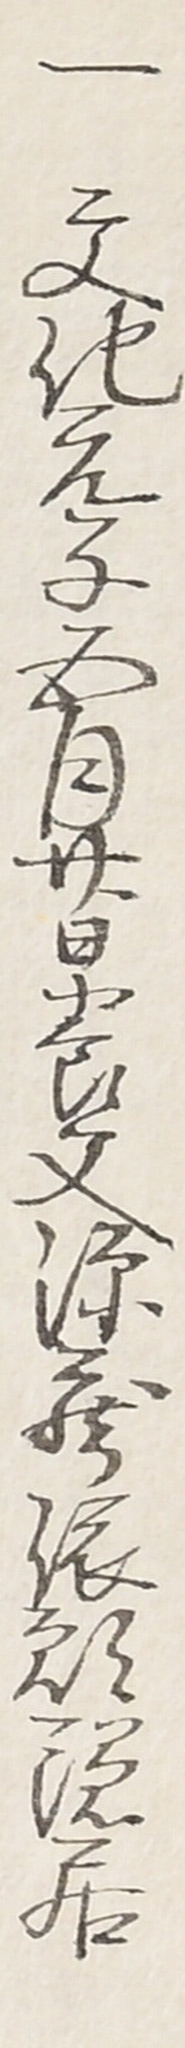一文化元子五月廿日養父源蔵依願隠居
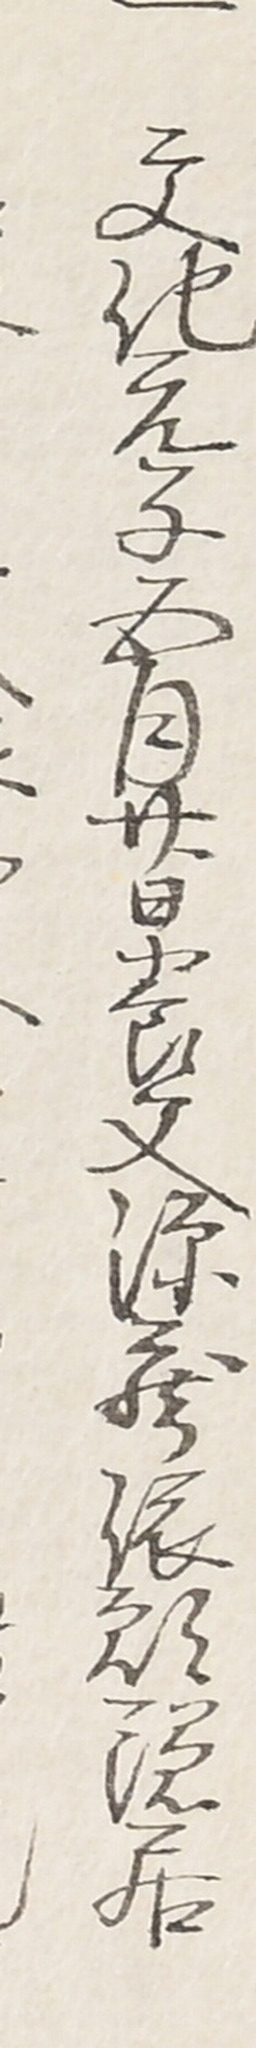一文化元子五月廿日養父源蔵依願隠居
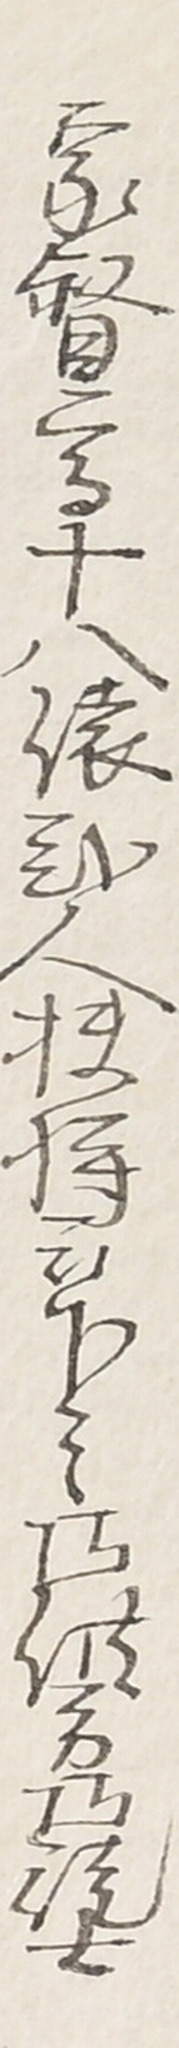家督高十八俵弐人扶持被下之御供方御徒士
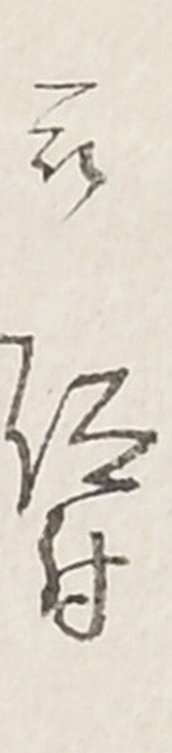被仰付
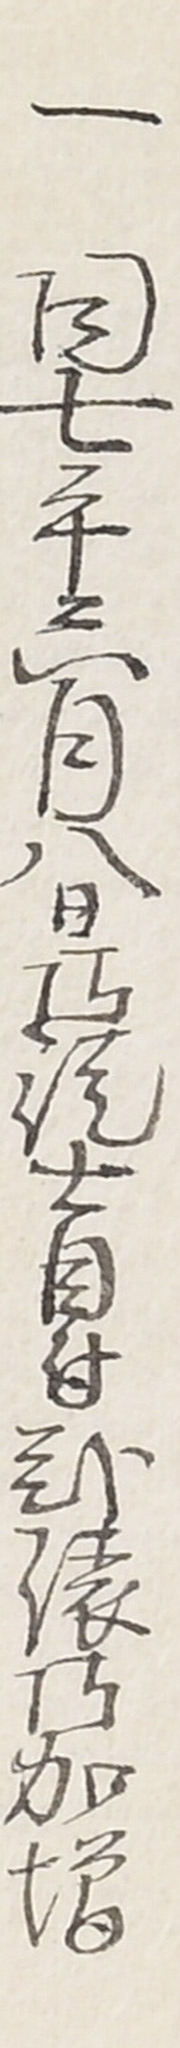一同七午六月八日御徒士目付弐俵御加増
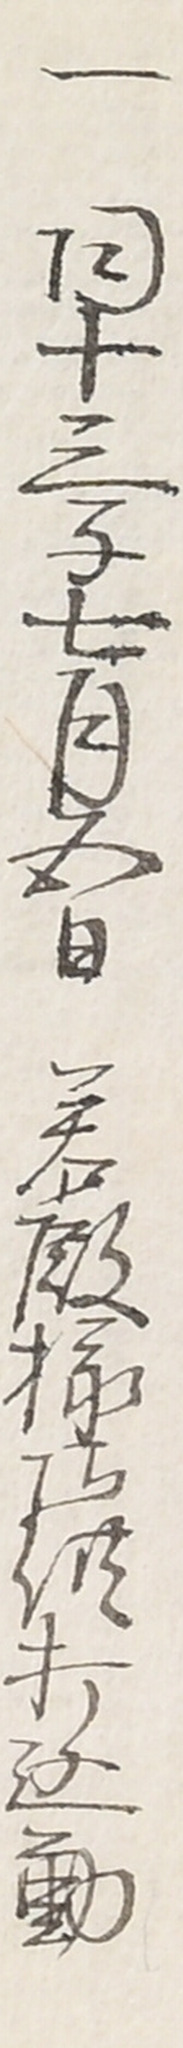一同十三子七月五日若殿様御供打込勤
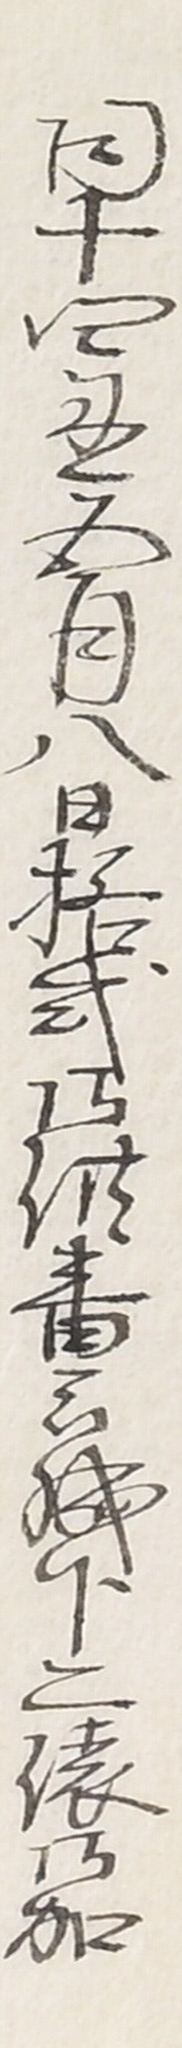一同十四丑五月八日格式御供番被成下二俵御加
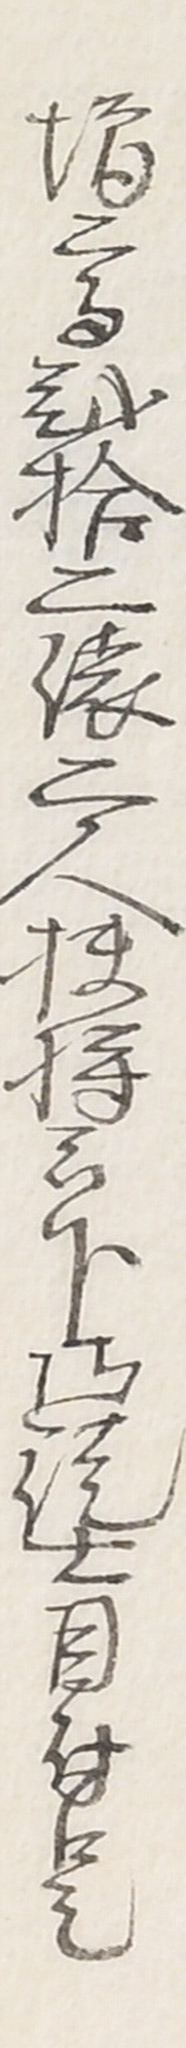増高弐拾二俵二人扶持被下御徒士目付是
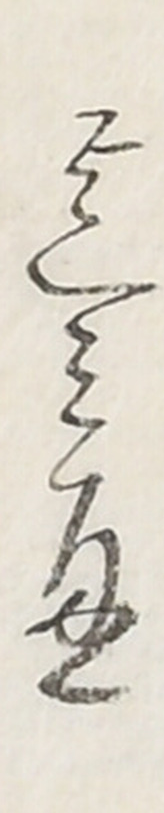迄之通
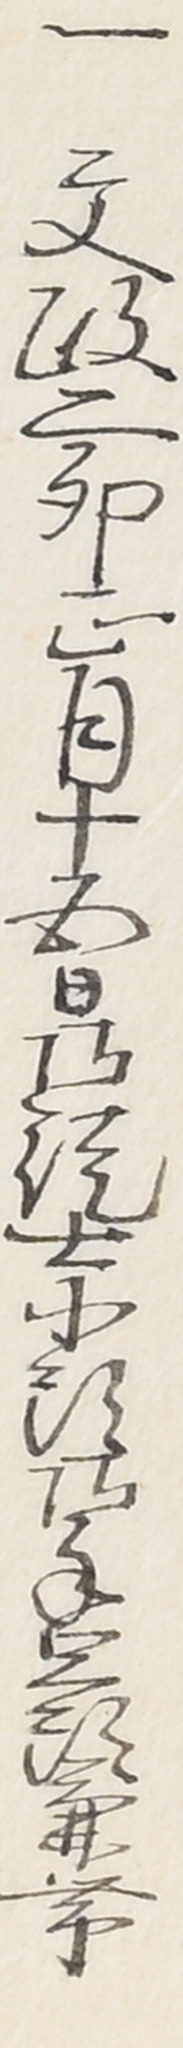一文政二卯正月十五日御徒士小頭御手廻頭兼帯
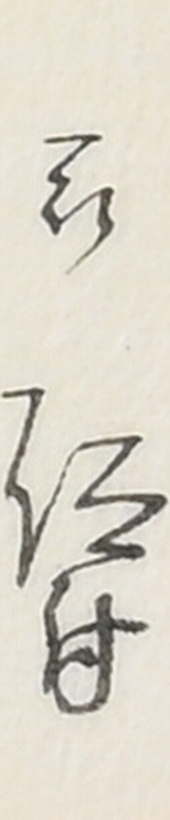被仰付
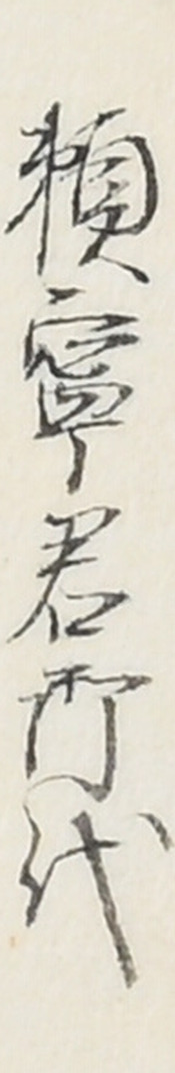頼寧君御代
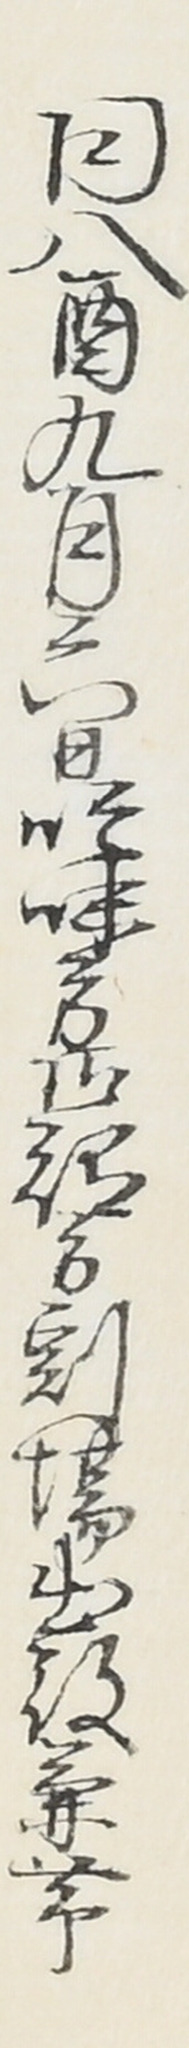一同八酉九月六日吟味方御賄方割場出役兼帯
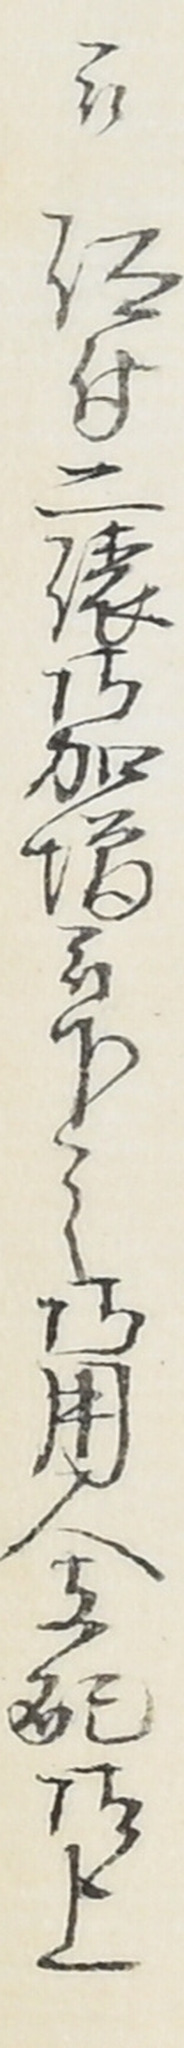被仰付二俵御加増被下之御用人支配御上
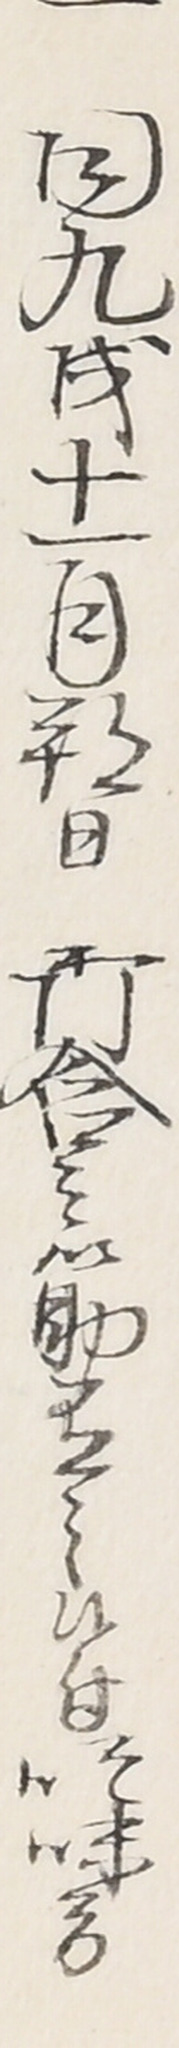一同九戌十一月朔日御含之筋有之候付吟味方
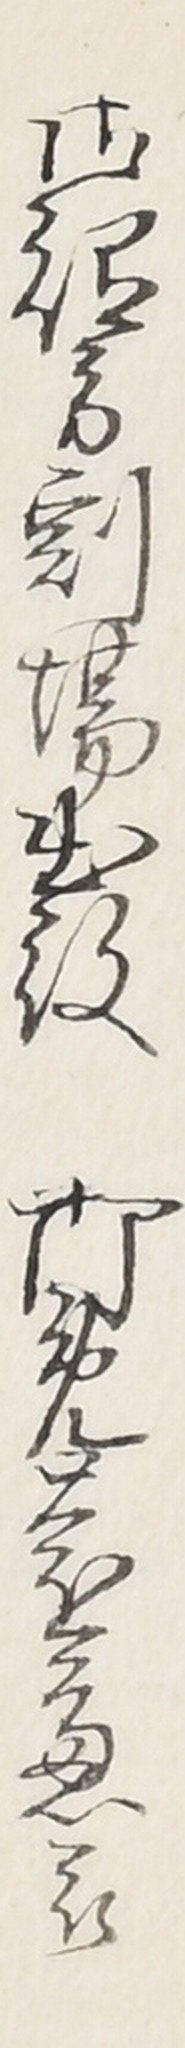御賄方割場出役御免遠慮被
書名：無足諸士勤仕録（四）
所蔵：伊那市立高遠町図書館・合同会社AMANE
